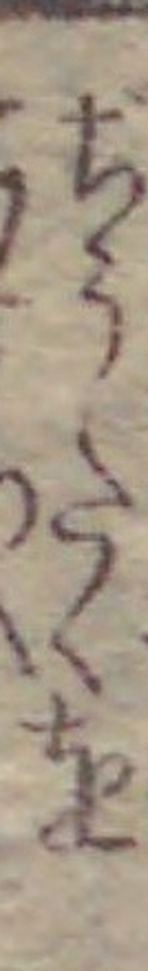ぢうたくを
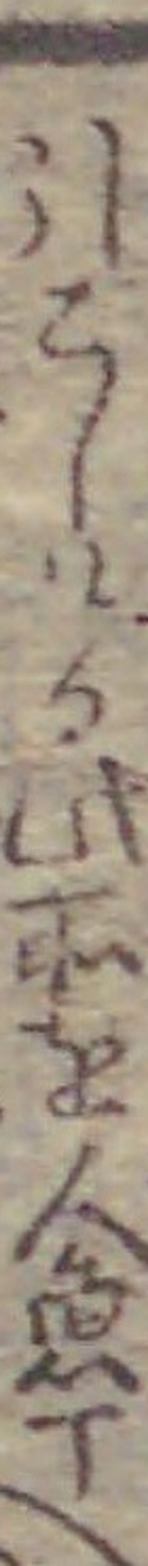引こしける此所を人魚丁
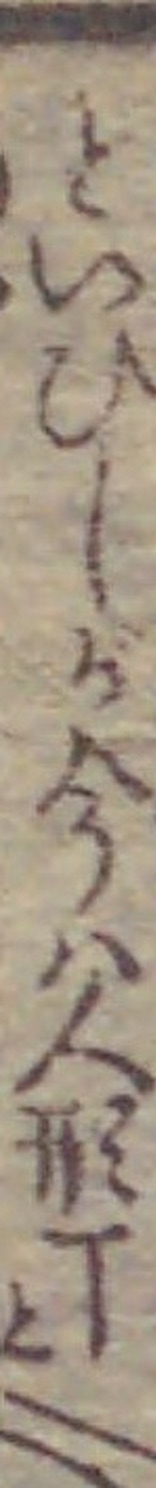といひしが今は人形丁と
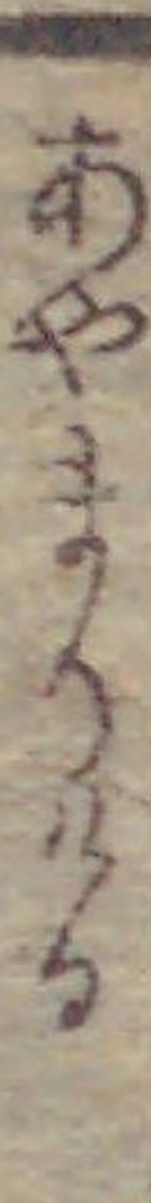あやまりける

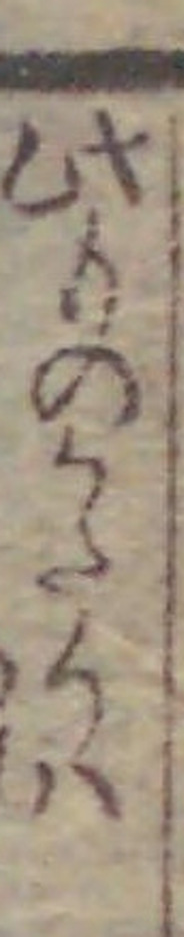此ものかたりは
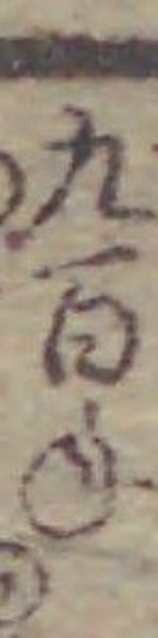九百年
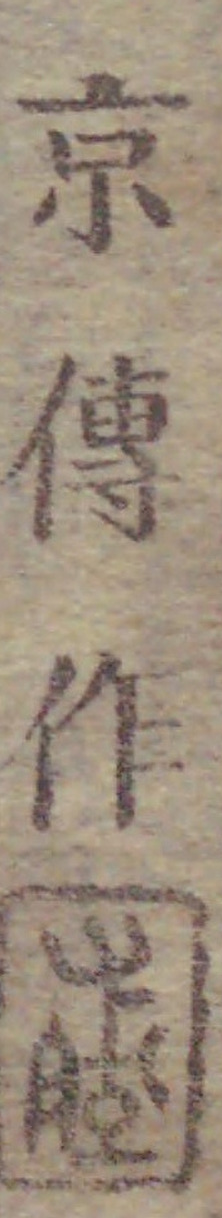京伝作
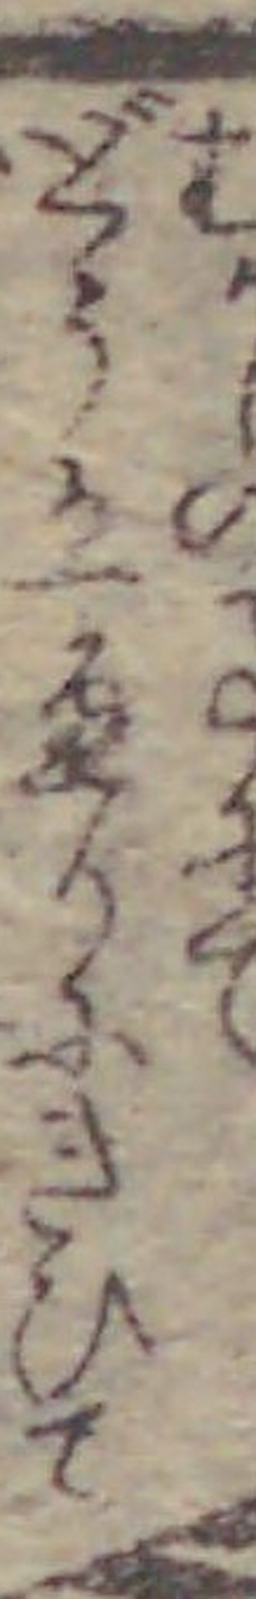どうか一通りにきひて
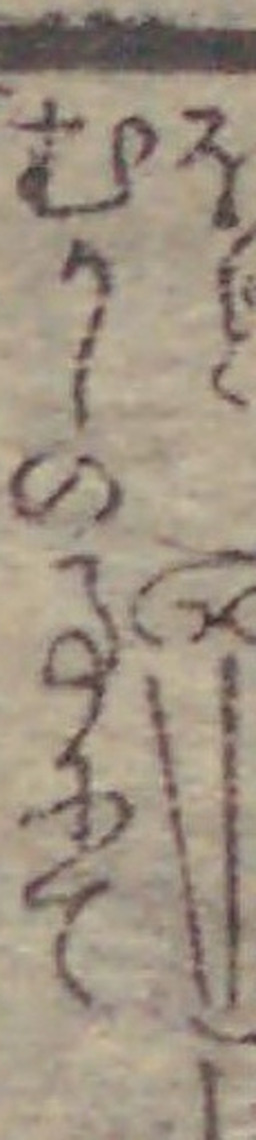むかしの事にて
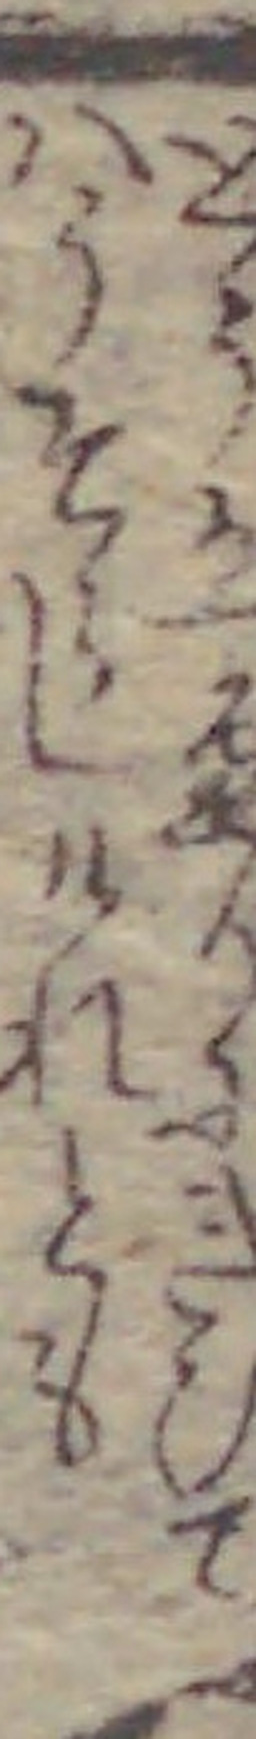はうそらしけれども
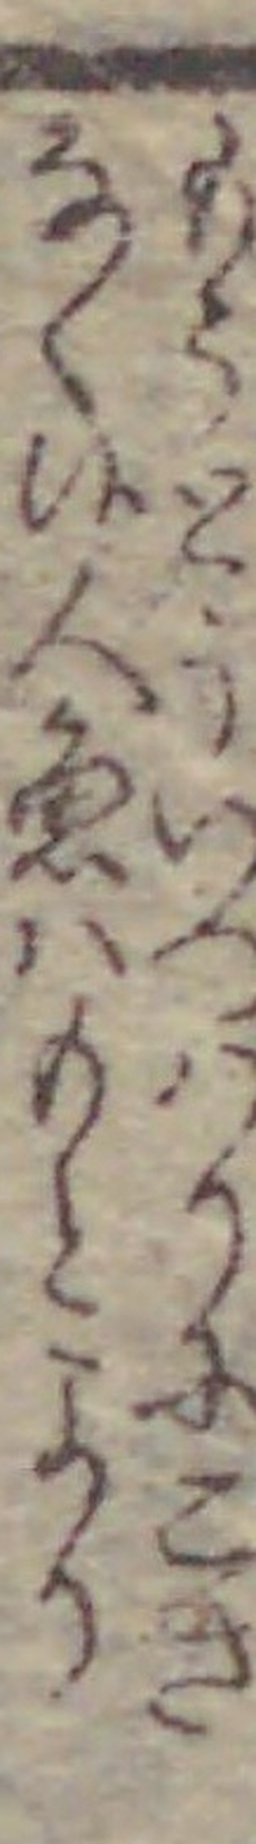なく候人魚はもとより
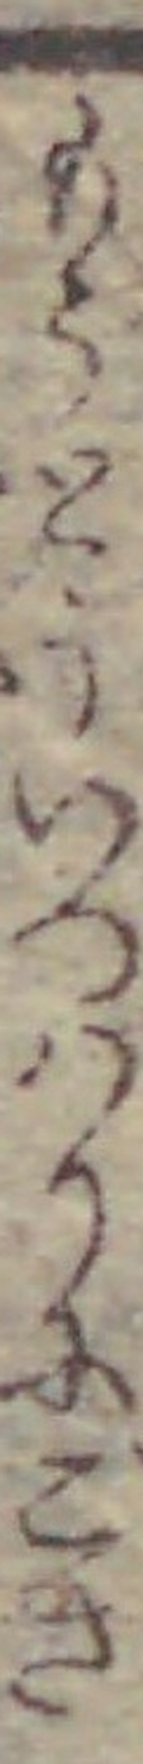もうとういつはりにござ
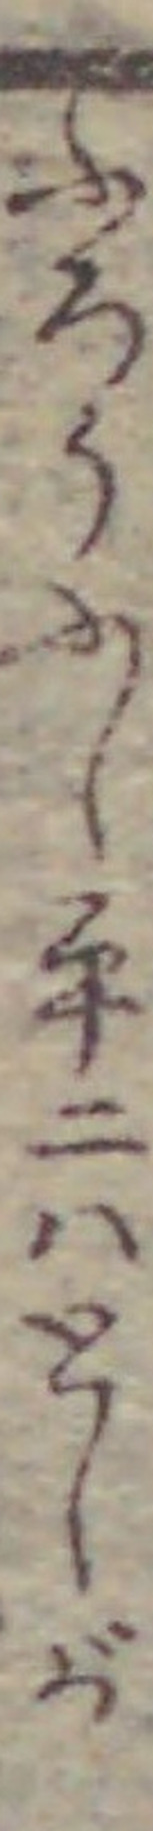ふろうにし平二はとしが
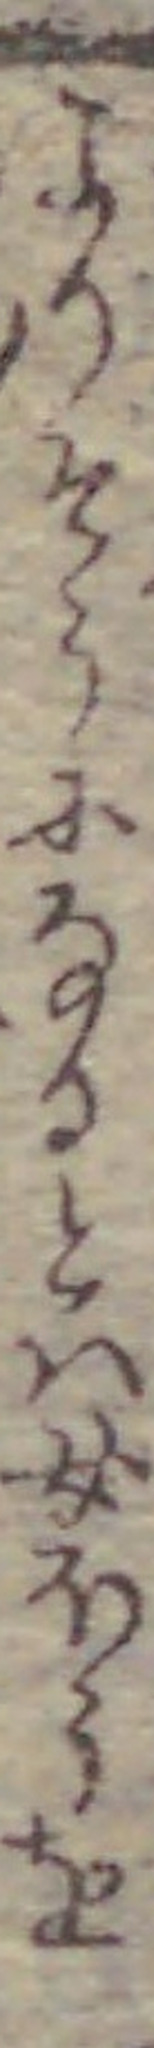よりそうになるとは女ほうを
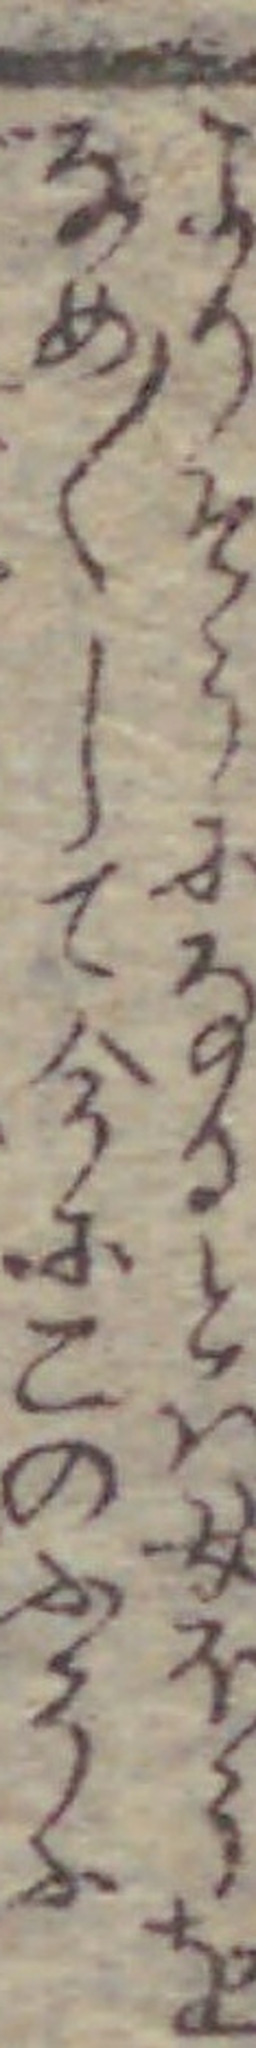なめ〳〵して今にこのふうふ
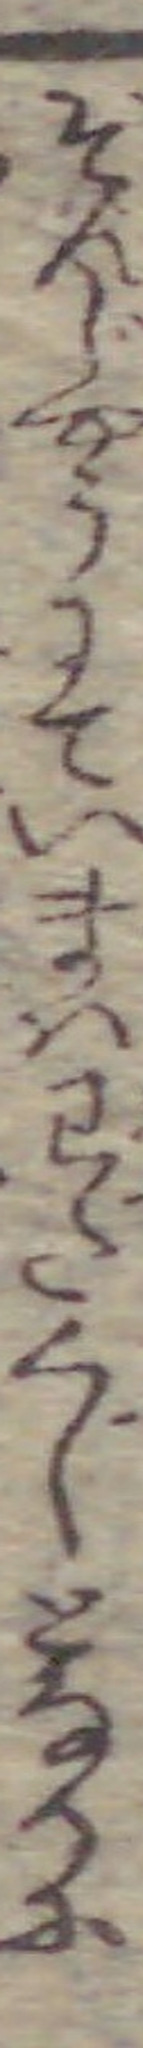ぞんじやうにていまはわたくしとなりに
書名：箱入娘面屋人魚 3巻
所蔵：国立国会図書館 National Diet Library, JAPAN
